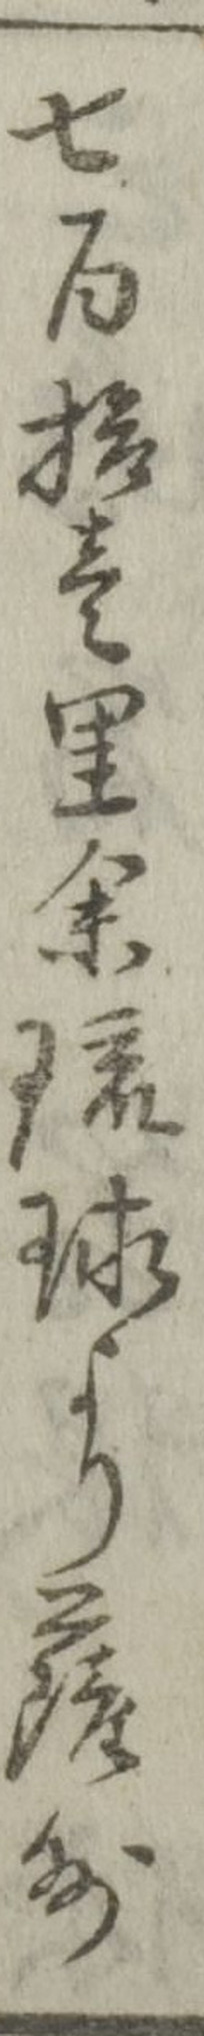七百拾壱里余琉球より薩州
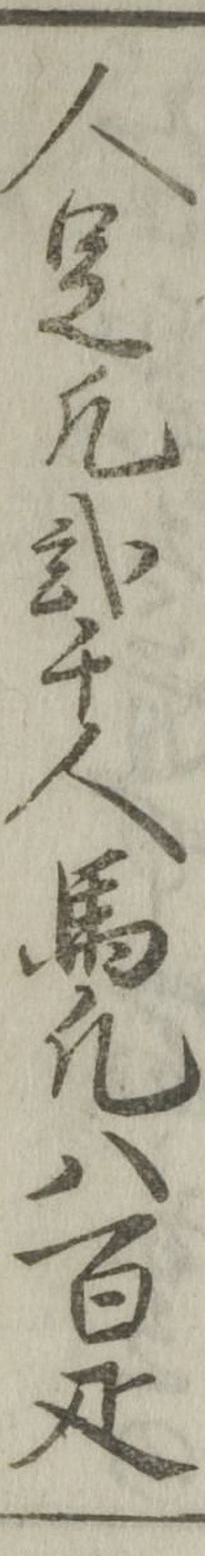人足凡弐千人馬凡八百疋
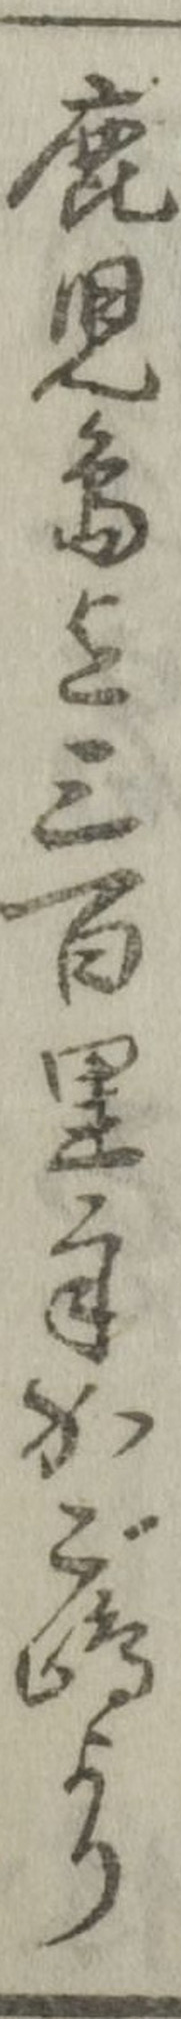鹿児島迄三百里余かご嶋より
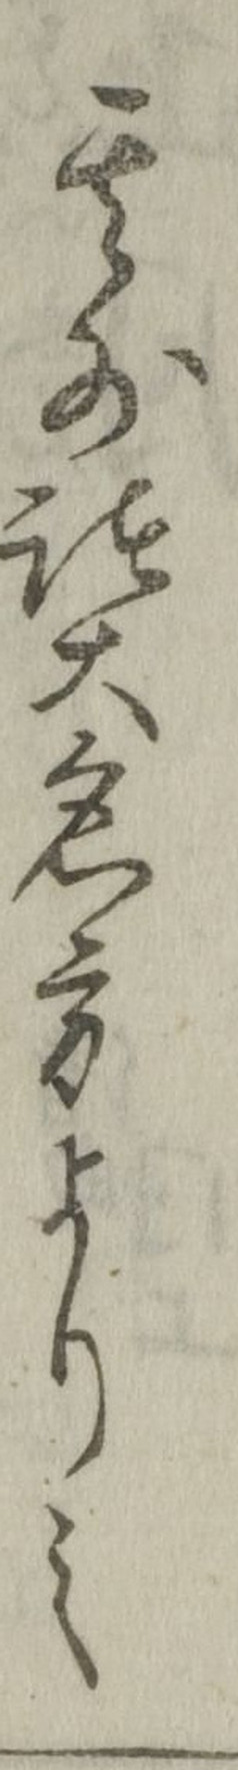其外諸大名方より之
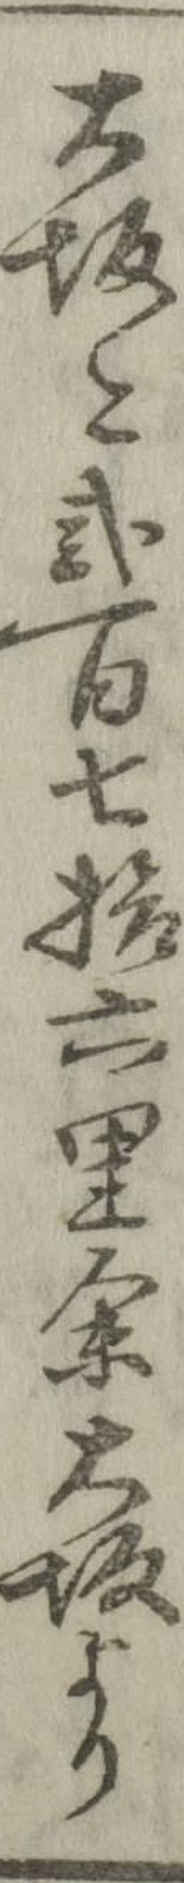大坂迄二百七拾六里余大坂より
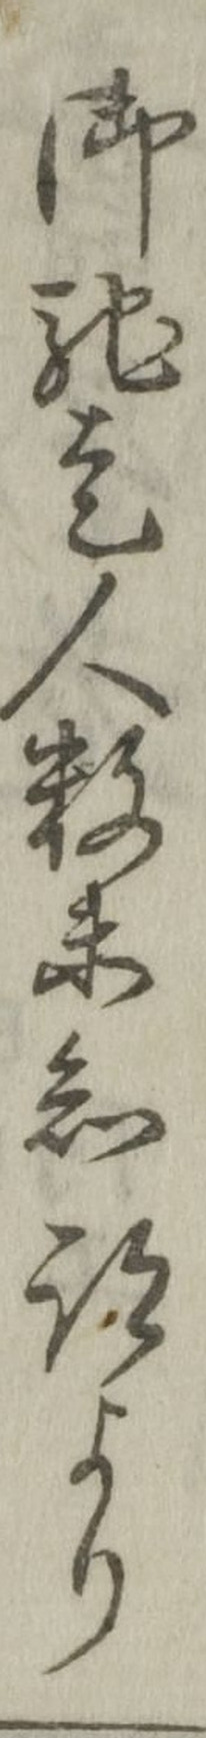御馳走人数未知跡より
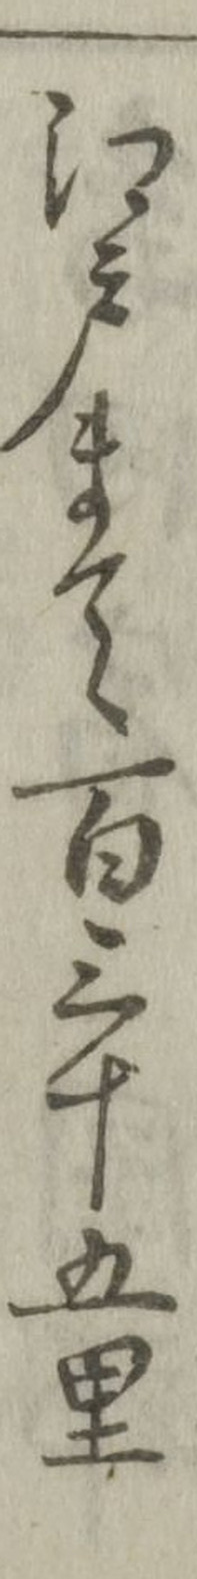江戸まて百三十五里
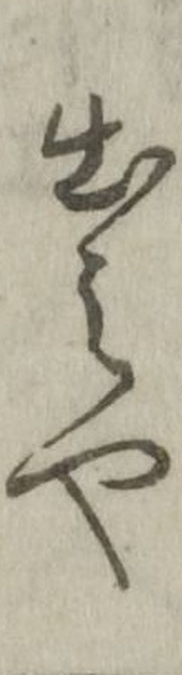出之也
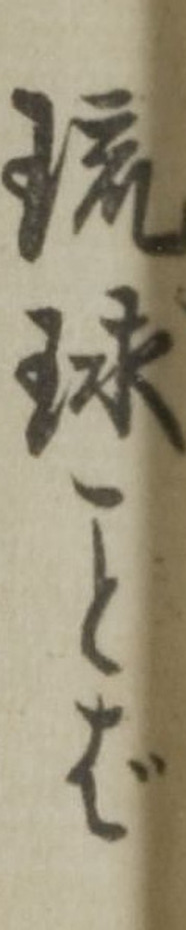琉球ことば
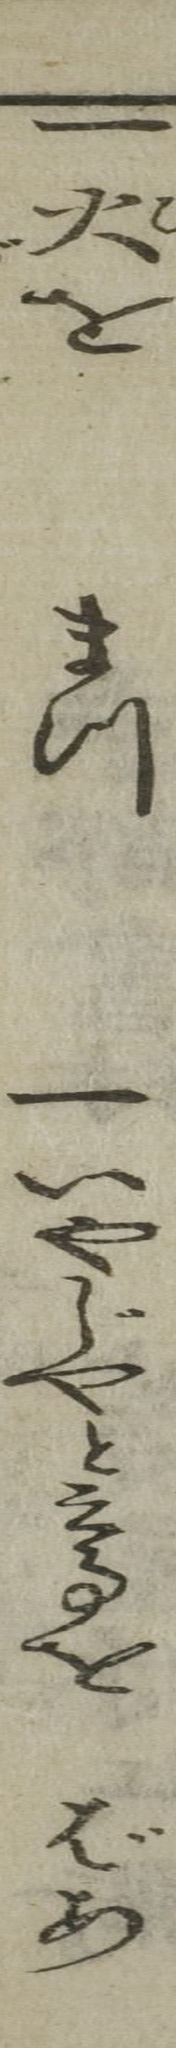一いやじやと云事をばあ
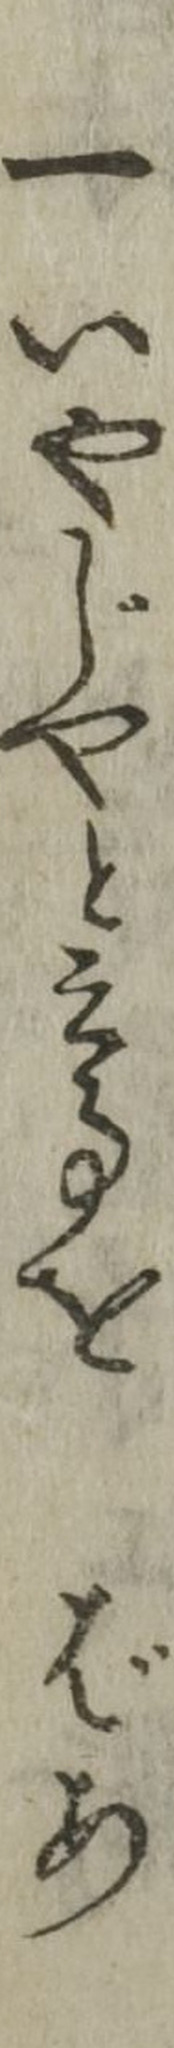一いやじやと云事をばあ
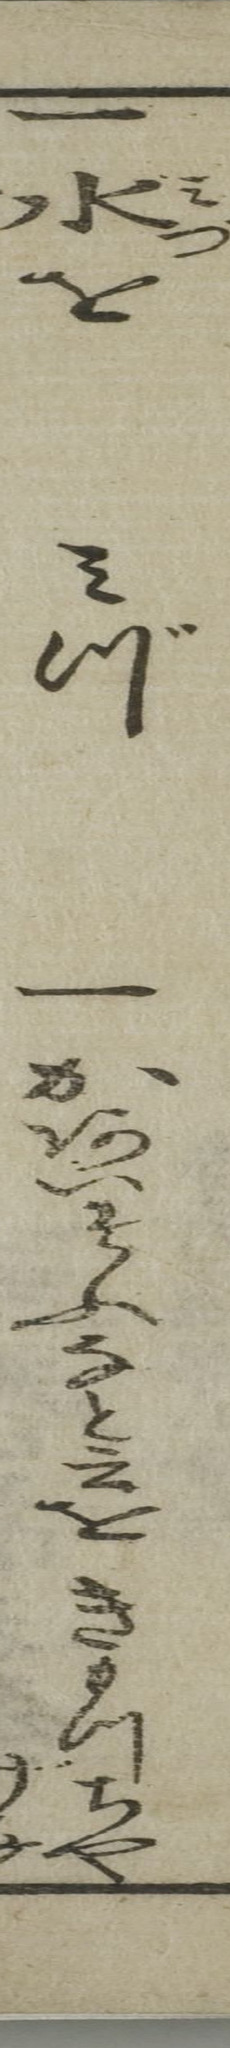一かあいそふなと云をきもつちやげな
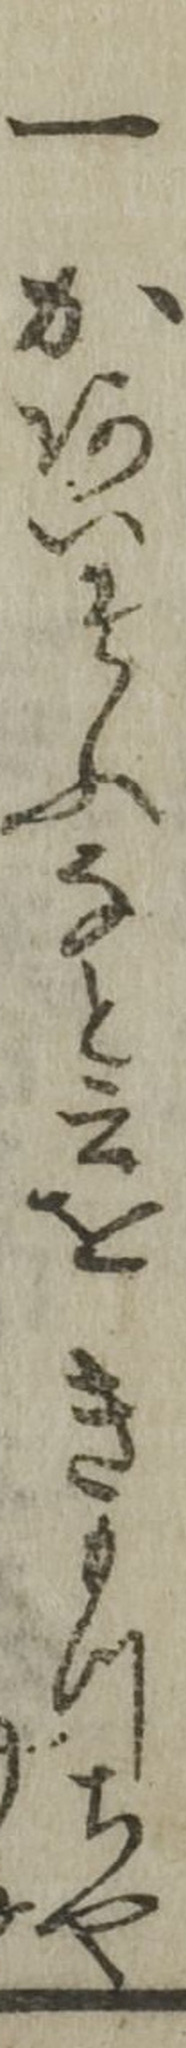一かあいそふなと云をきもつちやげな
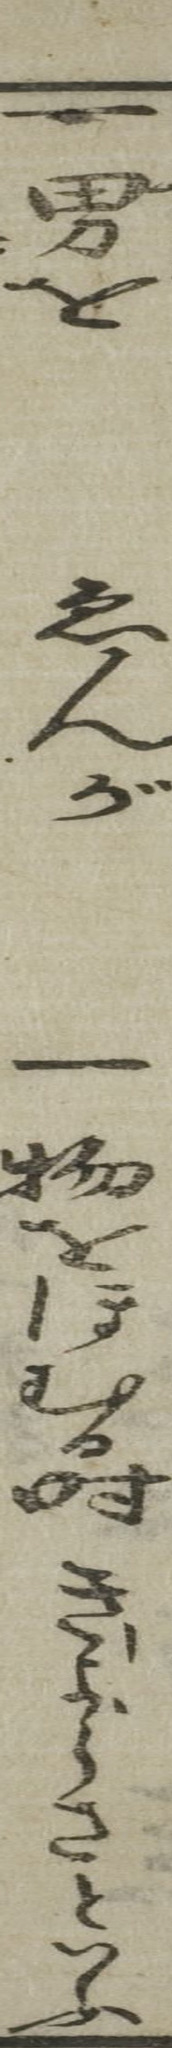一物をほむる時きよらさといふ
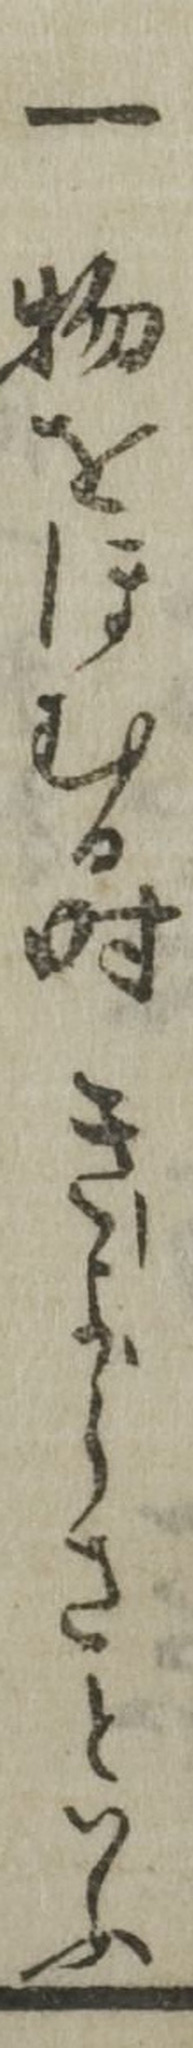一物をほむる時きよらさといふ
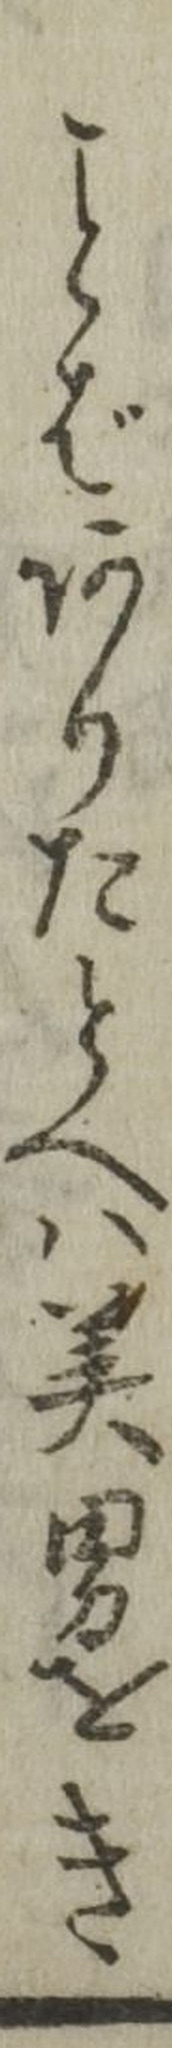ことばありたとへは美男をき
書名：琉球人行列記 天保3年
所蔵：University of the Ryukyus Library
